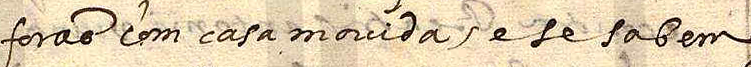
foraõ com casa mouida, e se sabem
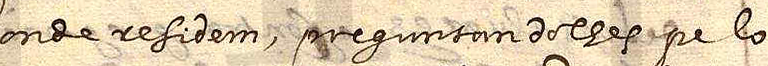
onde residem, preguntandolhes pelo
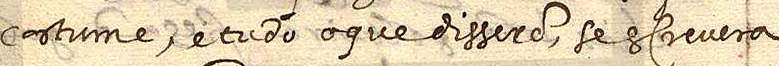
costume, e tudo o que disserā, se escreuera
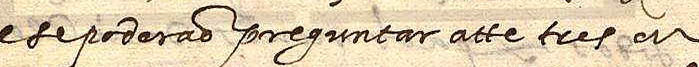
e se poderaõ preguntar atte tres ou
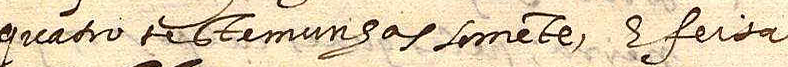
quatro testemunhas somēte, E feita
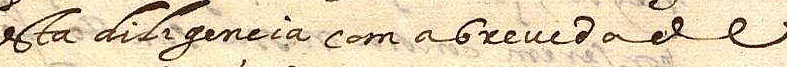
esta diligençia com a breuidade
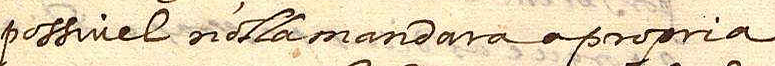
possiuel nolla mandara a propria
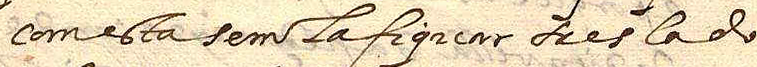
com esta sem La fiquar treslado
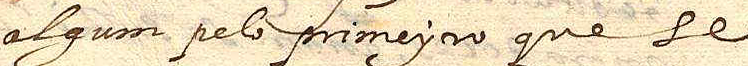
algum pelo primeyro que se
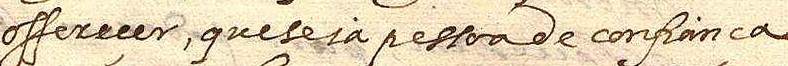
offereçer, que seia pessoa de confiança
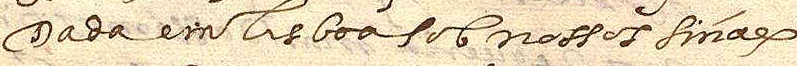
Dada em Lisboa sob nossos sinaes
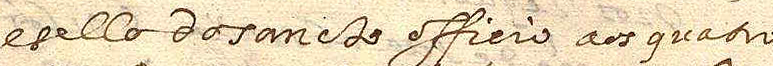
e sello do sancto offiçio aos quatro
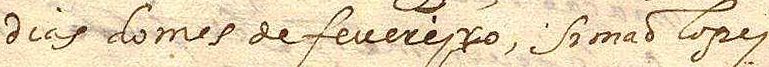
dias do mes de Feuereiro, Simaõ lopez
